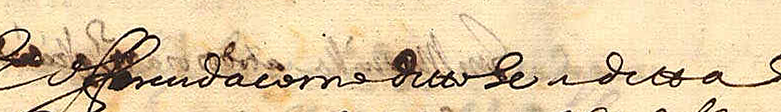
E offerecida como ditto he a ditta
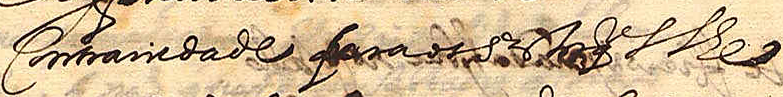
Contrariedade para os S.res Inqres lhe
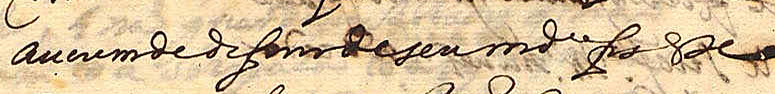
auerem de deferir de seu mdo fis este
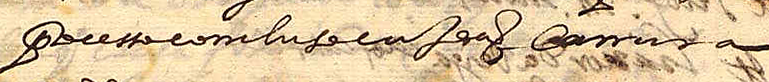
processo concluso eu Joaõ carneiro
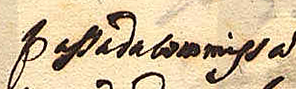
passada commissa
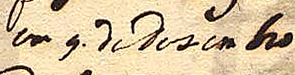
em 9. de Dezembro
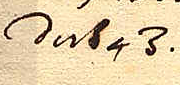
de i643.
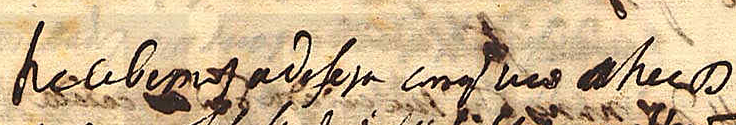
Recebemos a defesa com q̄ ueo a Ree D
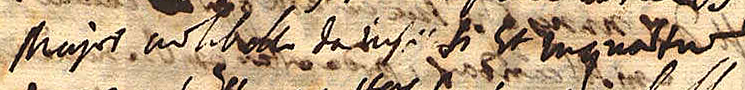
Major ao libello da iusta si St Inq naõ tiuer
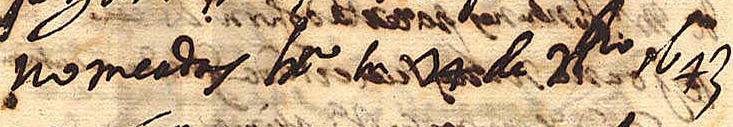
nomeadas Lx en 14 de n.bro 1643
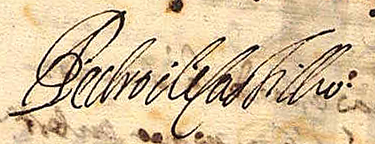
Pedro de Castilho
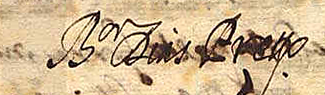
Bar Luis Prego
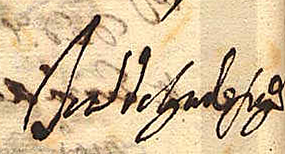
Joaõ delgado fgra
